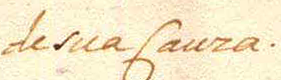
de sua Cauza.
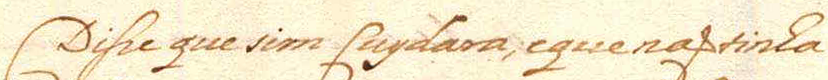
Disse que sim Cuydara, e que naõ tinha
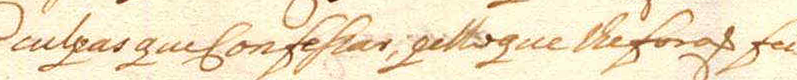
culpas que Confessar, pello que lhe foraõ fei
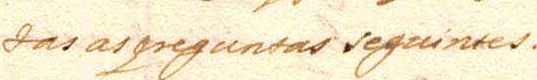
tas as preguntas seguintes.
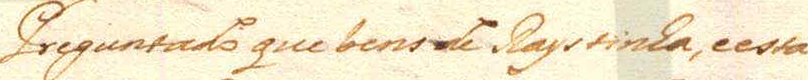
Preguntado que bens de Rays tinha, e esta
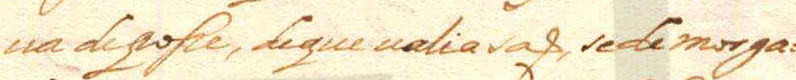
ua de posse, de que ualia saõ, se de morga
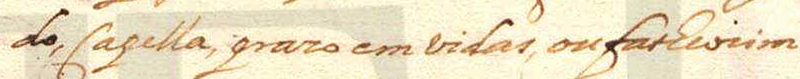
do, Capella, prazo em vidas, ou fatheozim
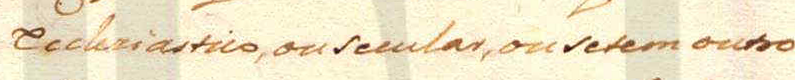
eccleziastico, ou secular, ou se tem outro
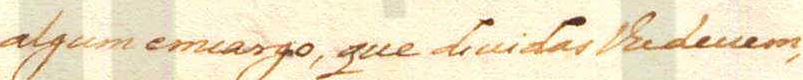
algum emcargo, que diuidas lhe deuem,
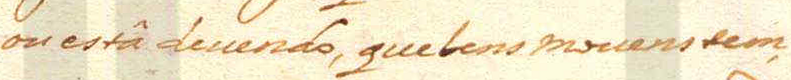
ou está deuendo, que bens mouens tem,
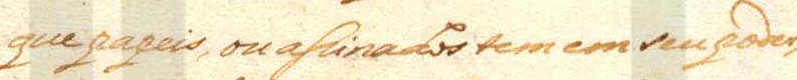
que papeis, ou asinados tem em seu poder,
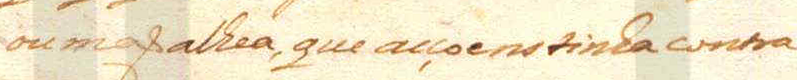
ou maõ alhea, que acçoens tinha contra
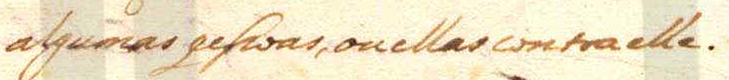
algumas pessoas, ou ellas contra elle.
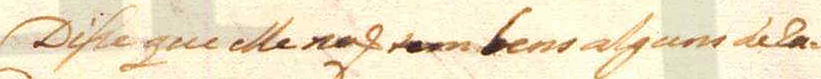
Disse que elle naõ tem bens alguns de Ra
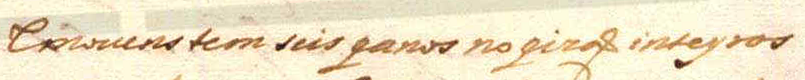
E mouens tem seis panos no pizaõ inteyros
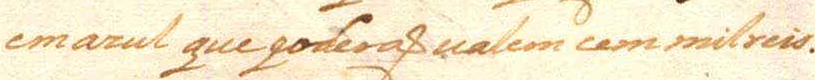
em azul que poderaõ ualem cem mil reis.
